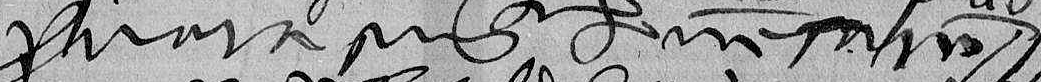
ꝓuara somte ho necesajro //
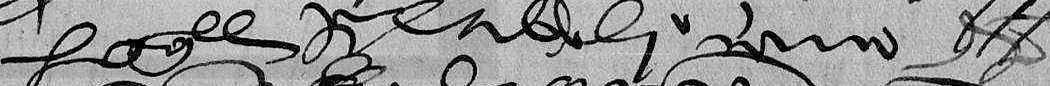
ho q̄ll trelado do ljo como dtō
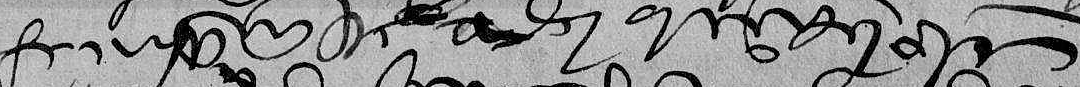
he eu sp̄m trelladej ꝯcertej oJe
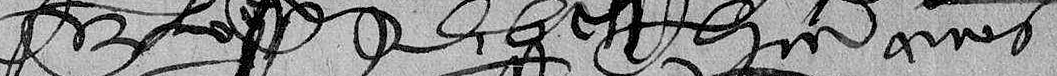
fr̄z ho esp̄uj de bc R huū anōs
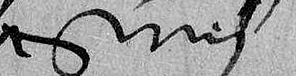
asinej
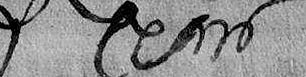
p̄ xx rr̄s
